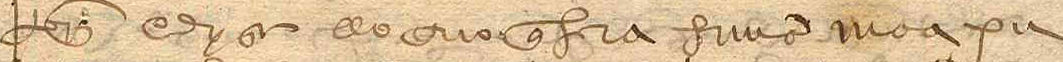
Rōjz e dyse lloguo q̄ hera huuā maa pu
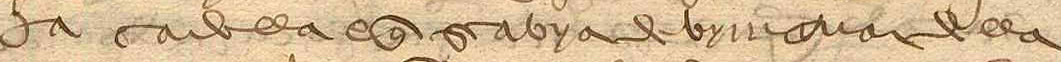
ta cadella e q̄ se avya de vymguar della
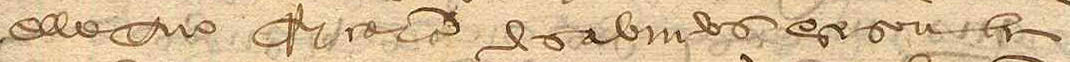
e lloguo fjcarā desavindos e se soube
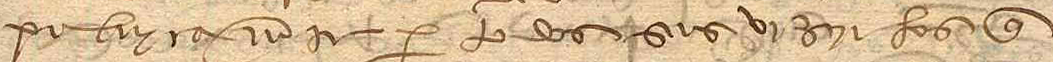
pobrycam̄te ꝑ todos seus vizynhos q̄
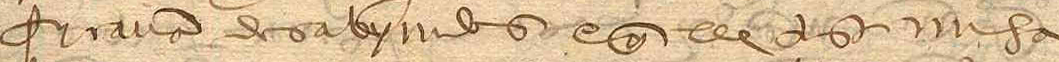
fycauā desavymdos e q̄ elle testemunha
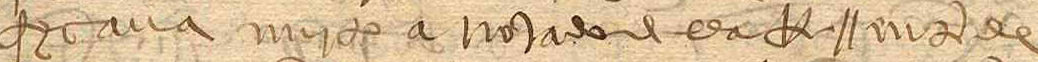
fycaua mujto anoJado della Re // entēde
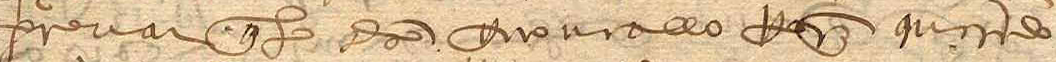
prouar q̄ ho dt̄o guoncallo Roj̄z querēdo
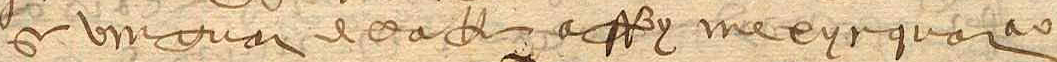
se vinguar della Re a ffoy mexyriquar ao
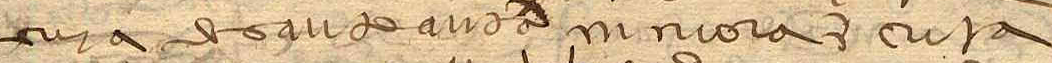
cura de santo antā en euora ē cuja
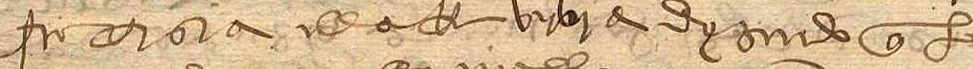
fregjsia ella Re vyvja dyzendo q̄ hou
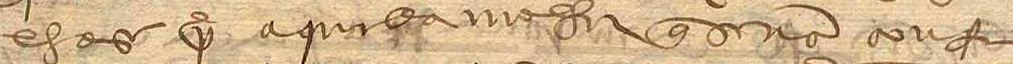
lhase p̄o aquella molher q̄ se nā confe
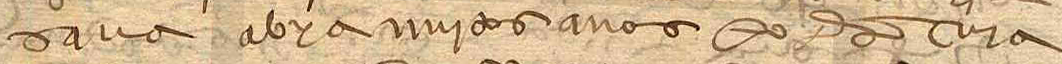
saua avya mujtos anos e o dt̄o cura
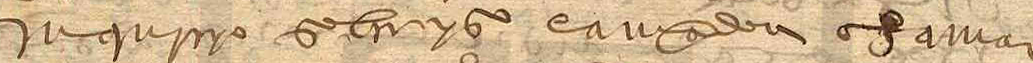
Jnqujryo sobre yso e a mādou chamar
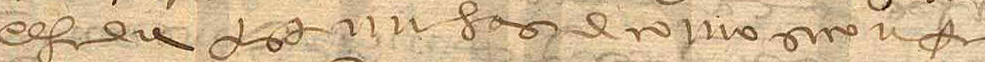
e lhe deu testemuhas de como se confe
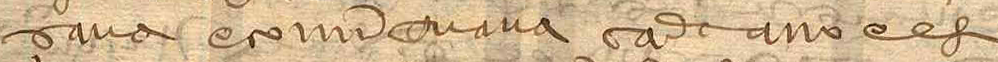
saua e comūgaua cada ano e lho
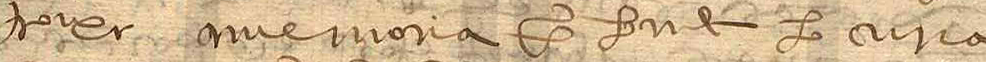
trouxe a memoria p̄o honde ho cura
